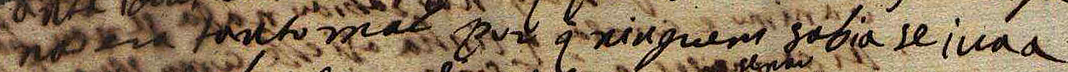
nao era tanto mal porq̄ ninguem sabia se iua a
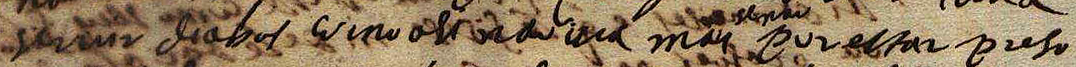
seruir diabos como asi ora iua mais senao por estar preso
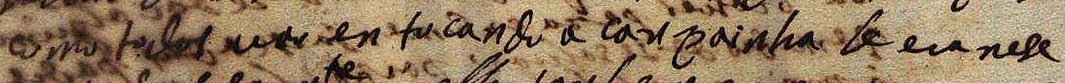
como todos uao en tocando a canpainha le era nese
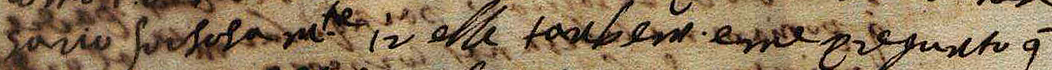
sario forsosam.te ir elle tanbem e me pregunto q̄
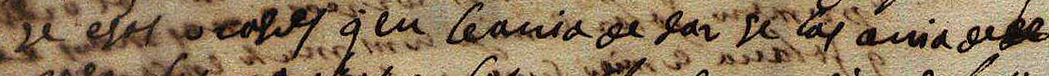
se esas orasoes q̄ eu le auia de dar se las auia de de
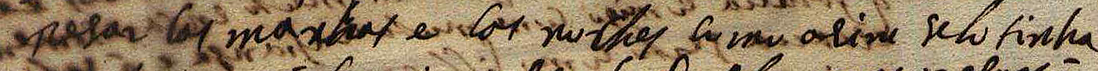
resar las manhas e las noches como asim se lo tinha
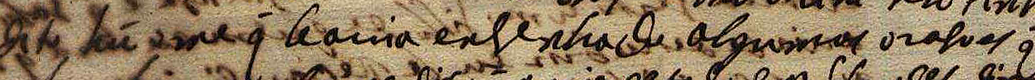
dito hū ome q̄ le auia ensenhado algumas orasoes q̄
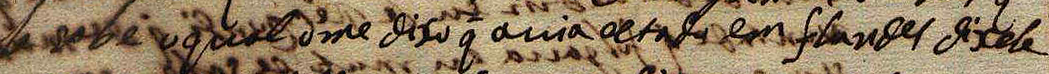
ele sabe o qual ome dixo q̄ auia estado em flandes dixele
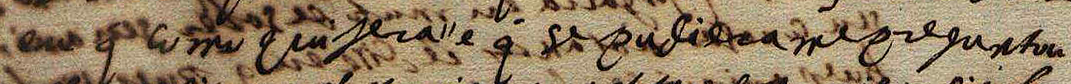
em q̄ como quizera e q̄ se pudiera me preguntou
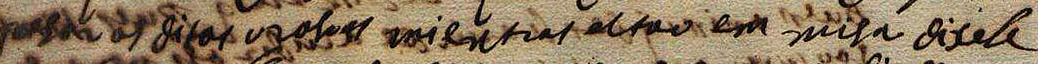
resar as ditas orasoes mientras estao em misa dixele
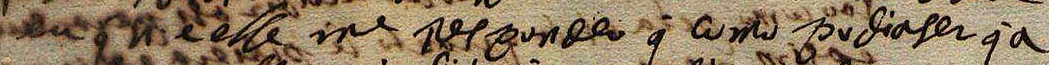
eu q̄ si e elle me Respondeo q̄ como podia ser q̄ a
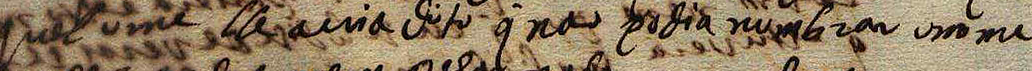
quel ome lle auia dito q̄ nao podia nombrar o nome
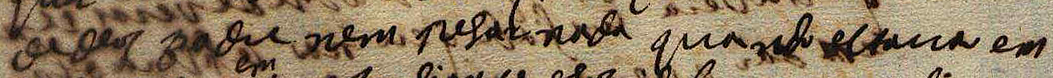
de deos padre nem Resar nada quando estaua em
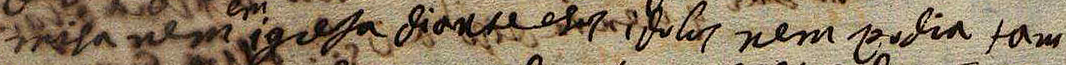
misa nem em igreJa diante esos idolos nem podia tam
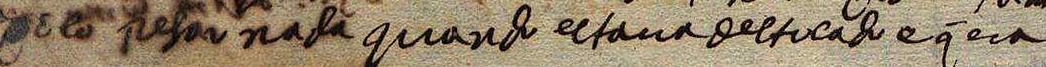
poco Resar nada quando estaua del tocado e q̄ era
